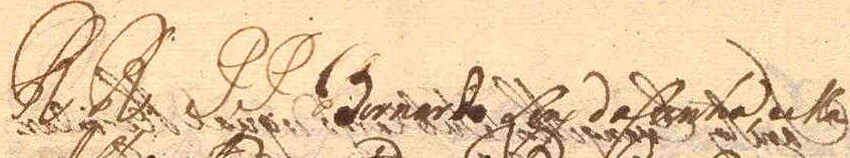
R.R. PP. Bernardo Lins da Cunha, e Ma
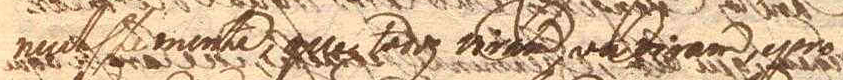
nuel Clemente, que todos viraõ, ouviram, e pro
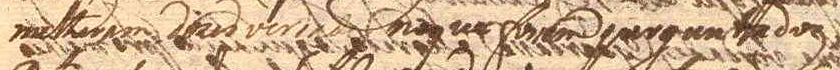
meteram dizer veriade no que fossem perguntadoz
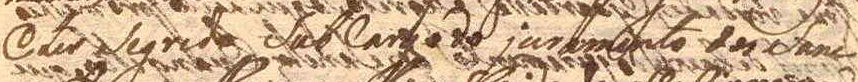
E ter Segredo Sub Cargo do juramento dos Sanc
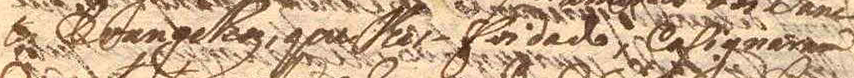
tos Evangelhoz, que lhes foi dado, E asignaram
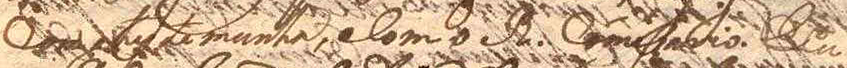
Com a testemunha, e Com o R. Com̄issario. Eu
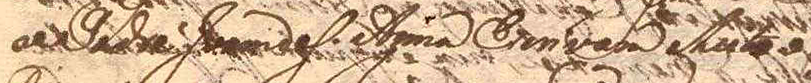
o Padre Joam de S. Anna Escrivam eleito o
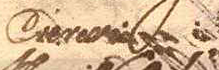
escrevi
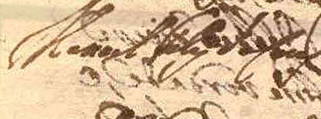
Manoel Felis da Crus
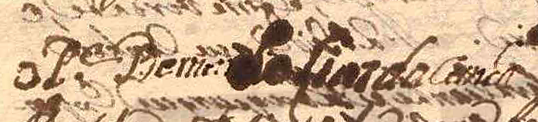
o P.e Bernardo Lins da cunha
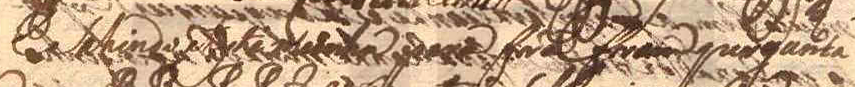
E sahindo a testemunha para fora foram pergunta
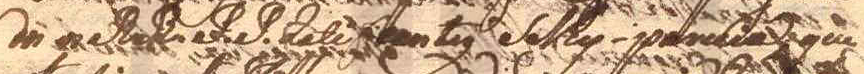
dos os RR. PP. Ratificantez se lhes - parecia que
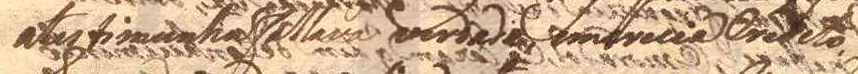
a testimunha fallava verdade, e merecia Credito,
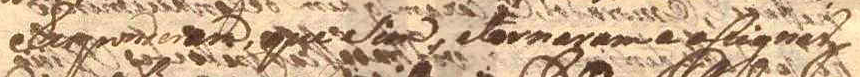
e Responderam, que sim, e tornaram a assignar
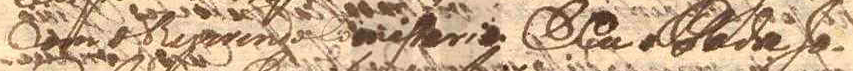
Com o Reverendo Comissario, E eu o Padre Jo
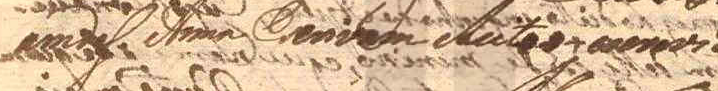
am de s. Anna Escrivam eleito o escrevi.
